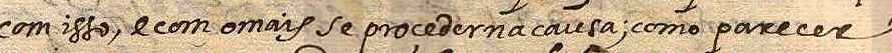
com isso, e com o mais se proceder na causa; como parecer
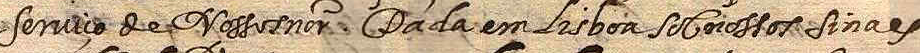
seruiço de Nosso snōr. Dada em Lisboa sob nossos sinaes
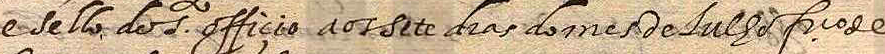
e sello do s.to officio aos sete dias do mes de Iulho frco de
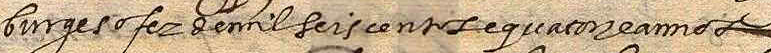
burges o fez de mil seiscentos e quatorze annos
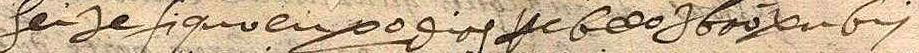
sertefiquo eu po dias Rebelo tbaõ pubrj
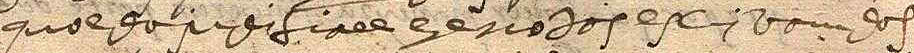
quo do judisiall he notas escrjuam dos
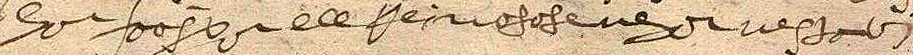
horfaõs por ell Rei noso senhor nesta vi
